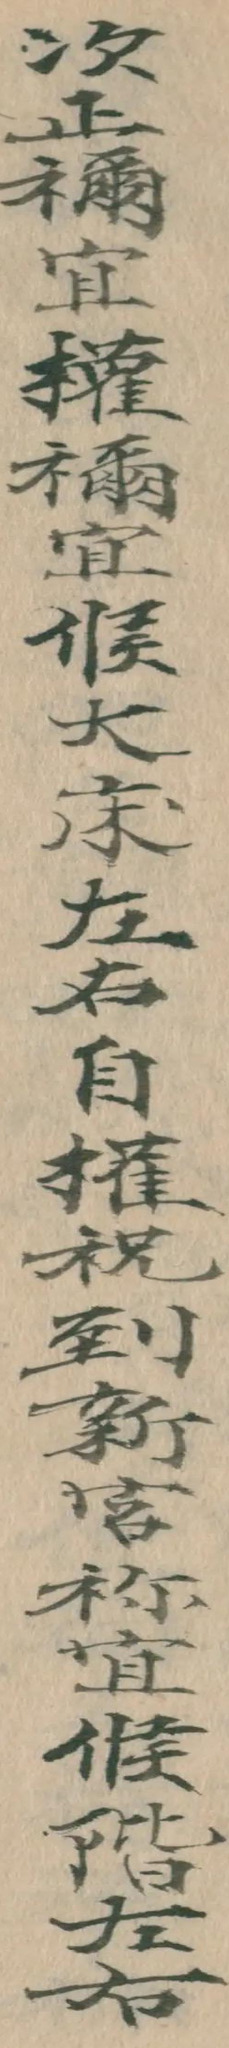次正祢宜権祢宜候大床左右自権祝到新宮称宜候階左右
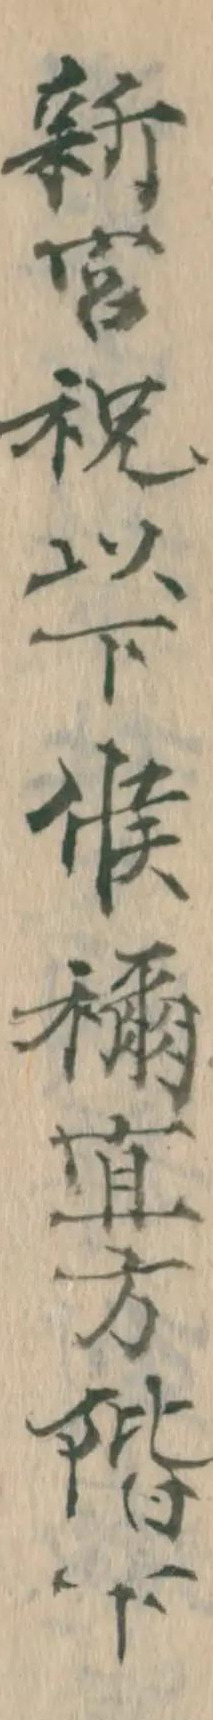新宮祝以下候祢宜方階下
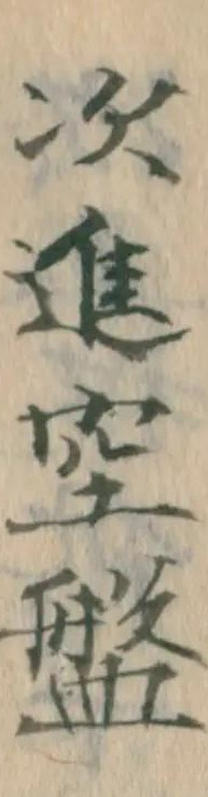次進空盤
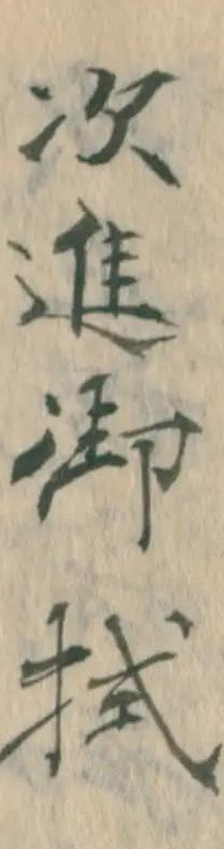次進御拭

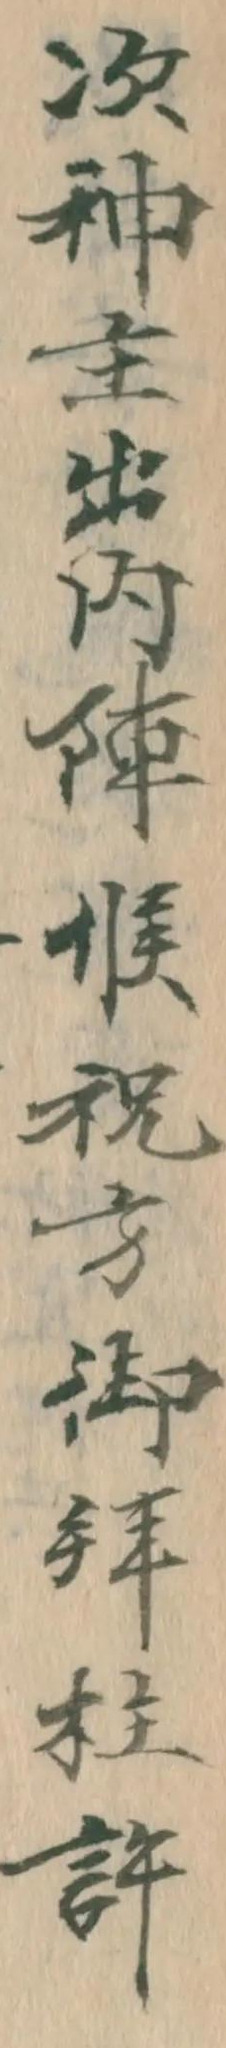次神主出内陣候祝方御拝柱許
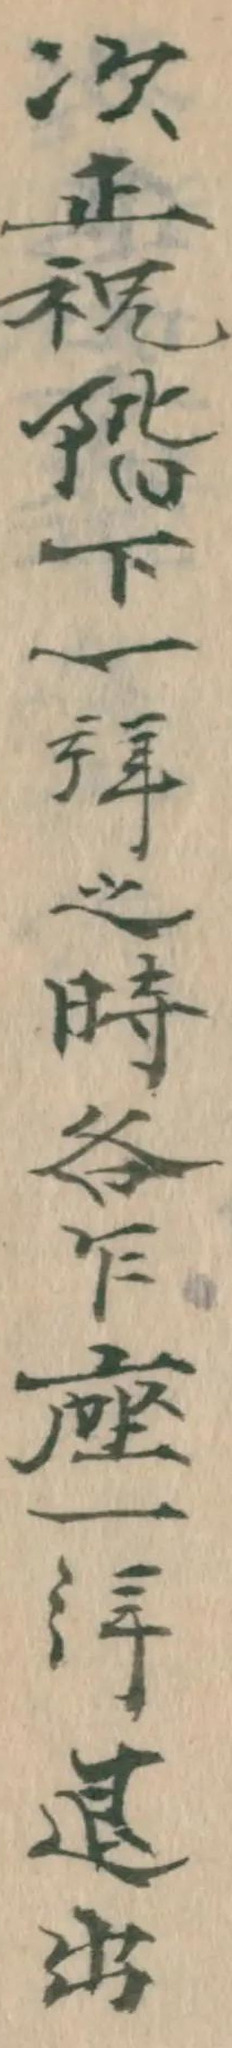次正祝階下一拝之時各乍座一拝退出
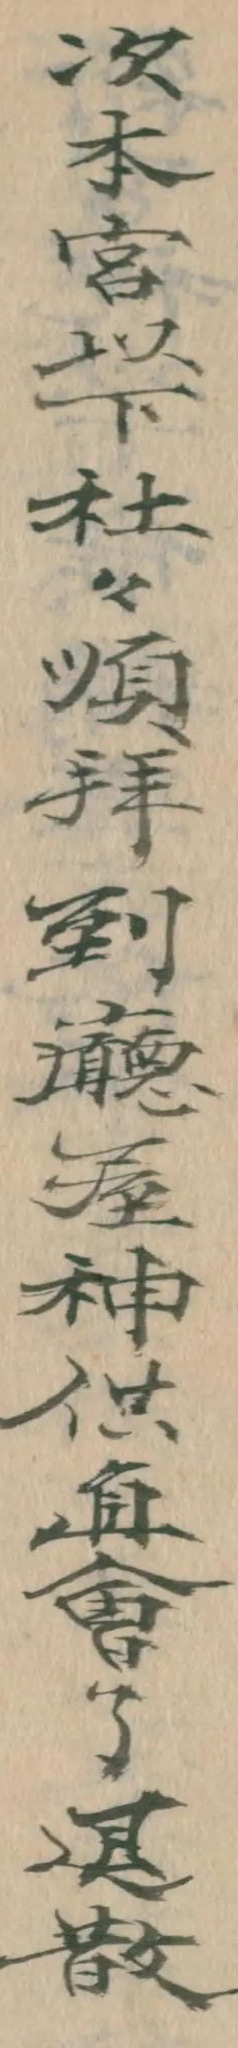次本宮以下社々順拝到庁屋神供直会了退散
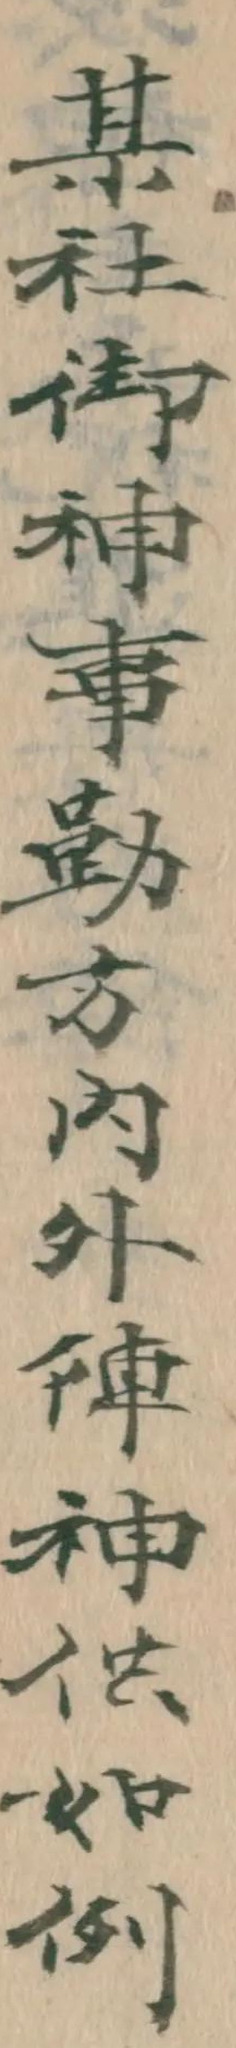某社御神事勤方内外陣神供如例
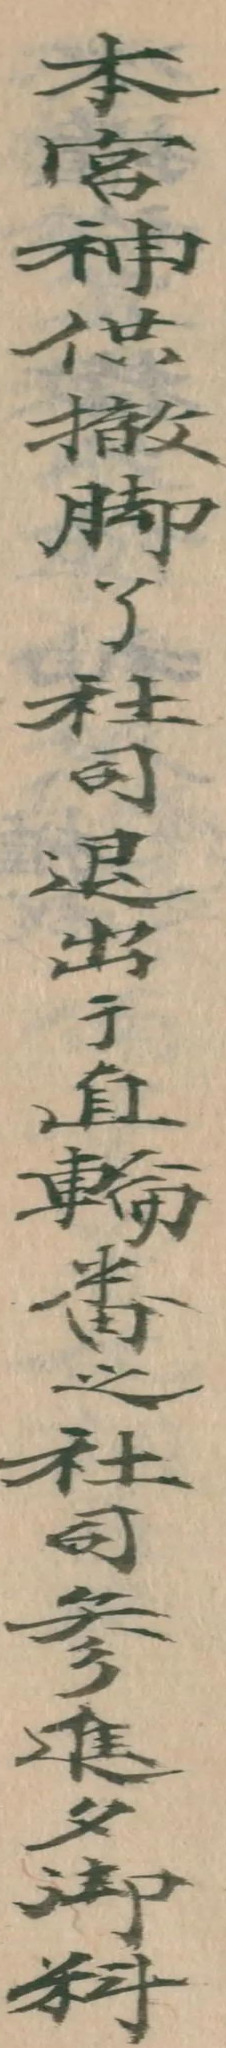本宮神供撤脚了社司退出于直輪番之社司参進夕御料
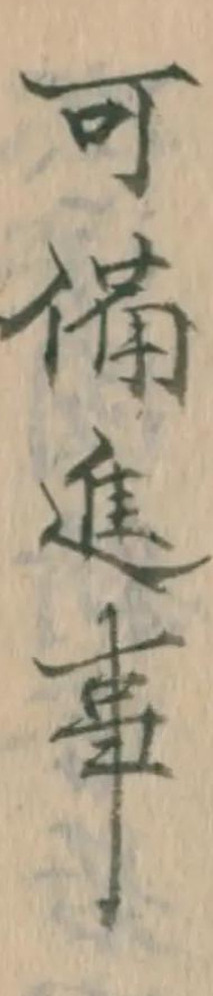可備進事
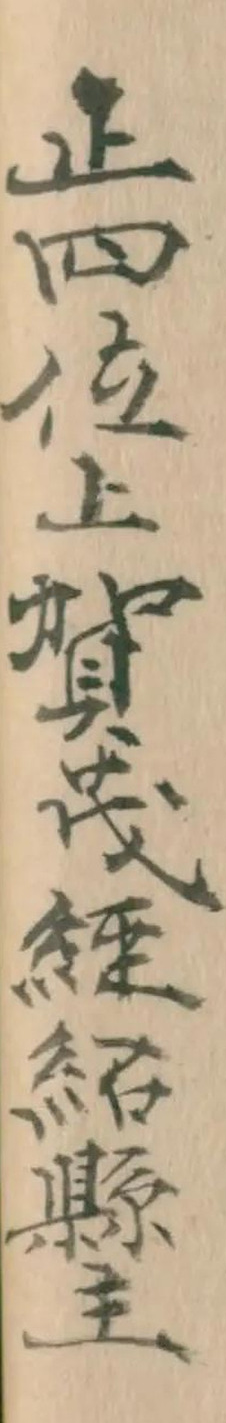正四位上賀茂経紹県主
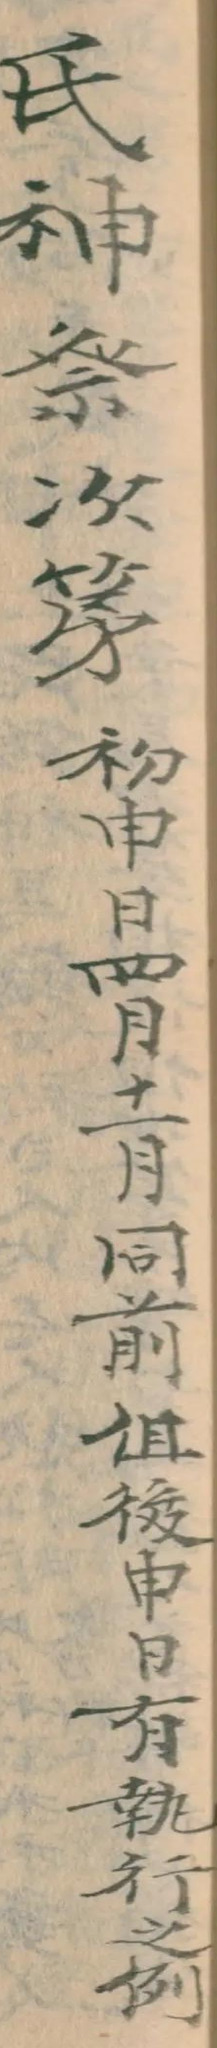氏神祭次第初申日四月十一月同前但後申日有執行之例
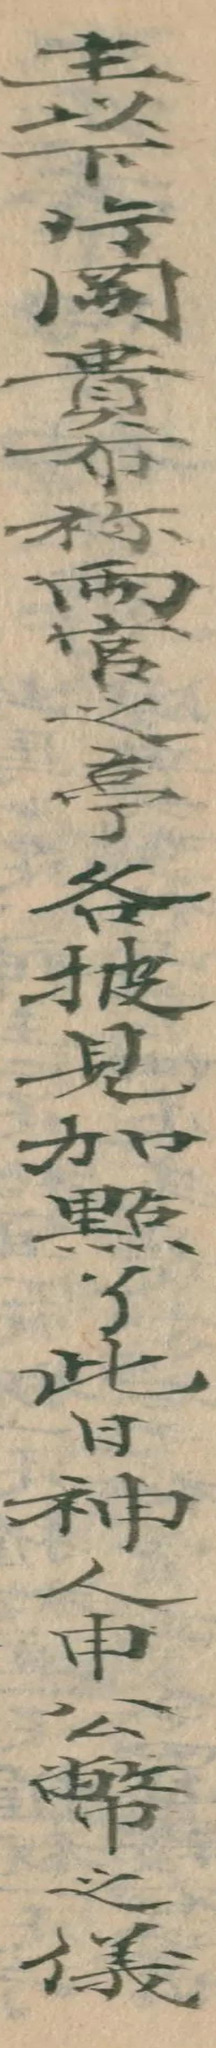主以下片岡貴ふね両官之亭各披見加点了此日神人申公幣之儀

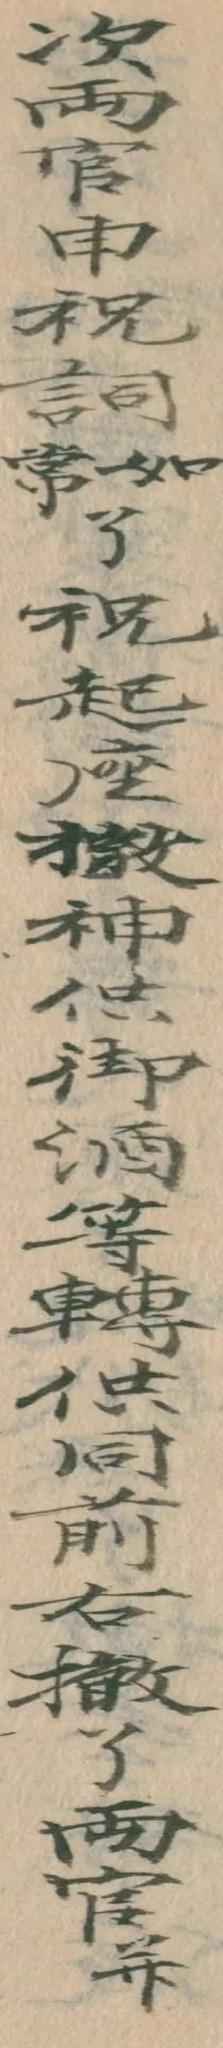次両官申祝詞如常了祝起座撤神供御酒等転供同前右撤了両官并

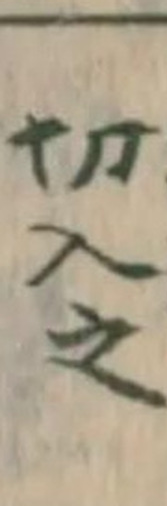切入之
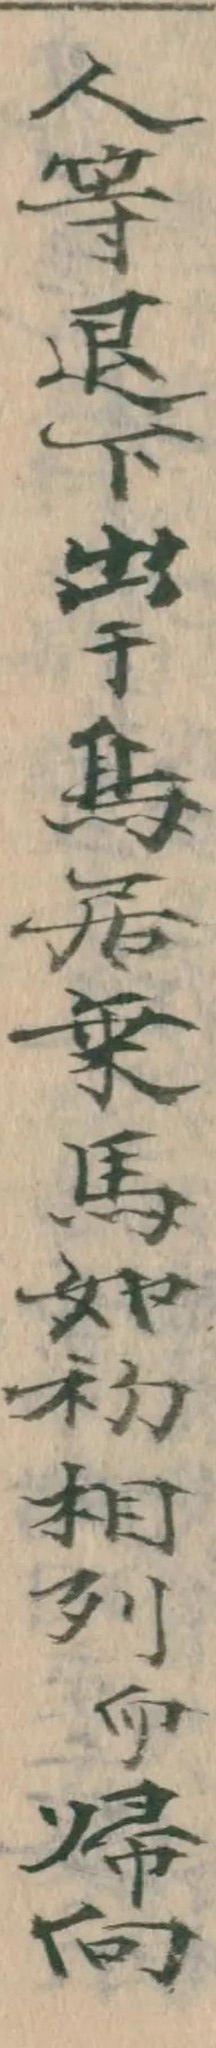人等退下出于鳥居乗馬如初相列而帰向
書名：賀茂社記録. 第9冊
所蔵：国立国会図書館 National Diet Library, JAPAN
